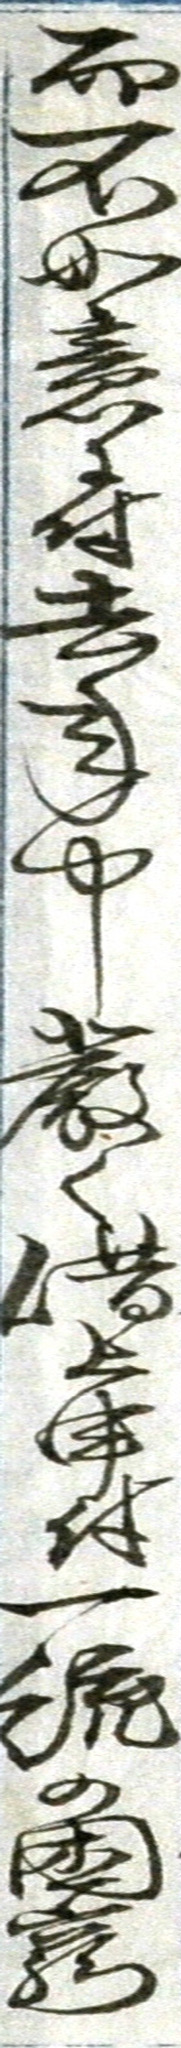而不如意に付去年中厳く借上申付一統の困窮
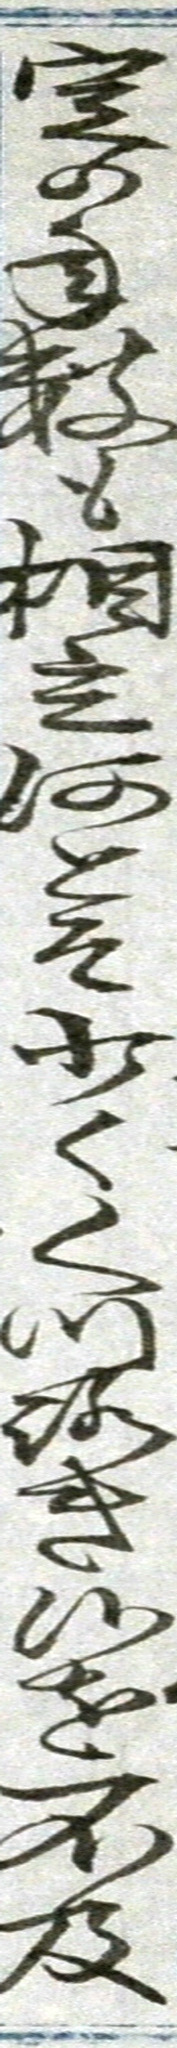定の年数も相立何とそ少くくつろき候を不及
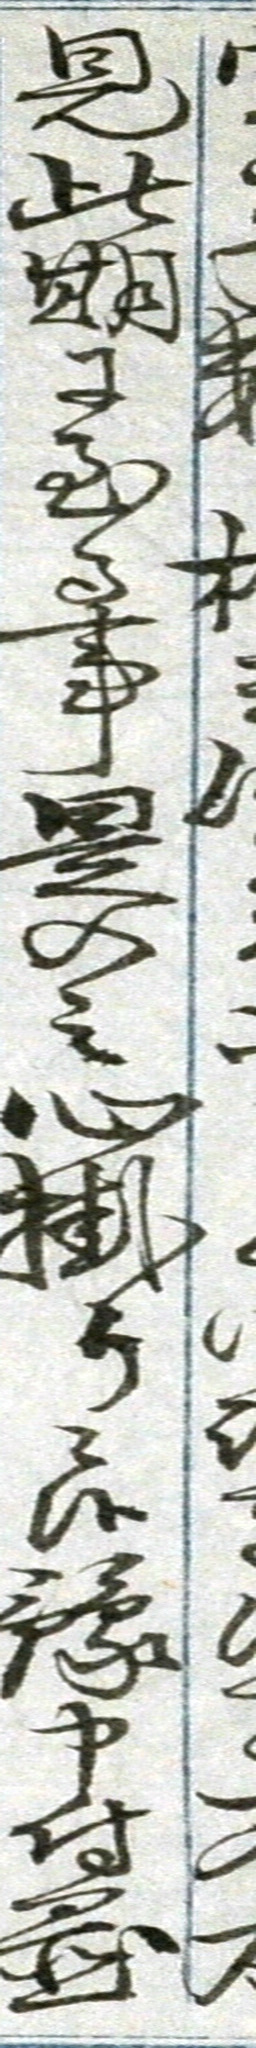見此期に至る事是のみ心掛りに候予申付置
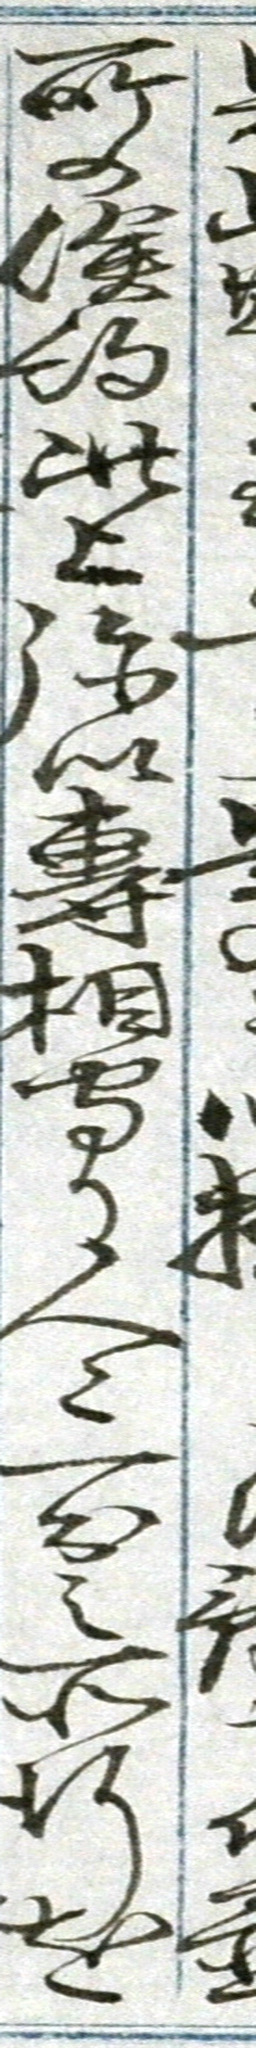所の倹約此上弥以専相守り人々一分之所行を
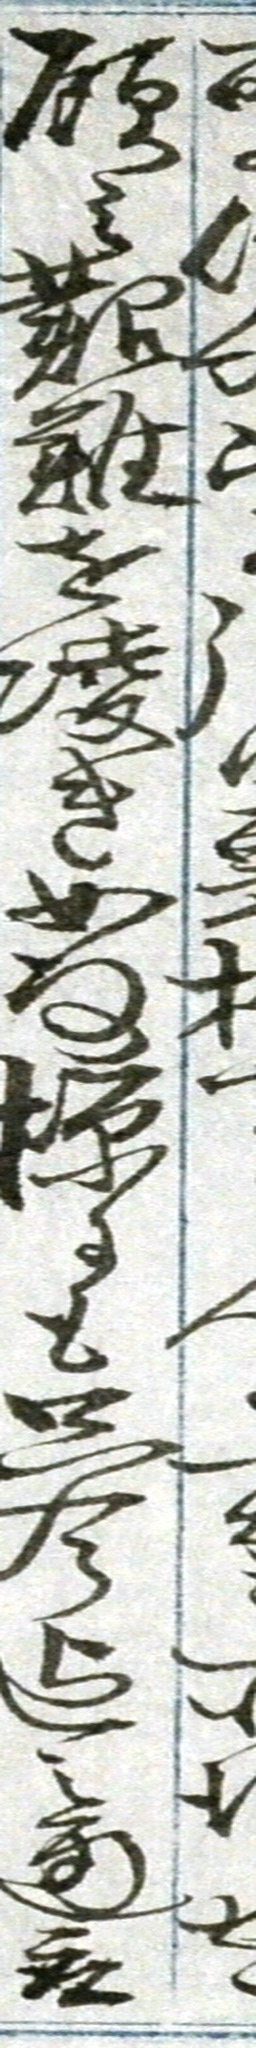顧み艱難を凌き如何様にも只今迄之通取
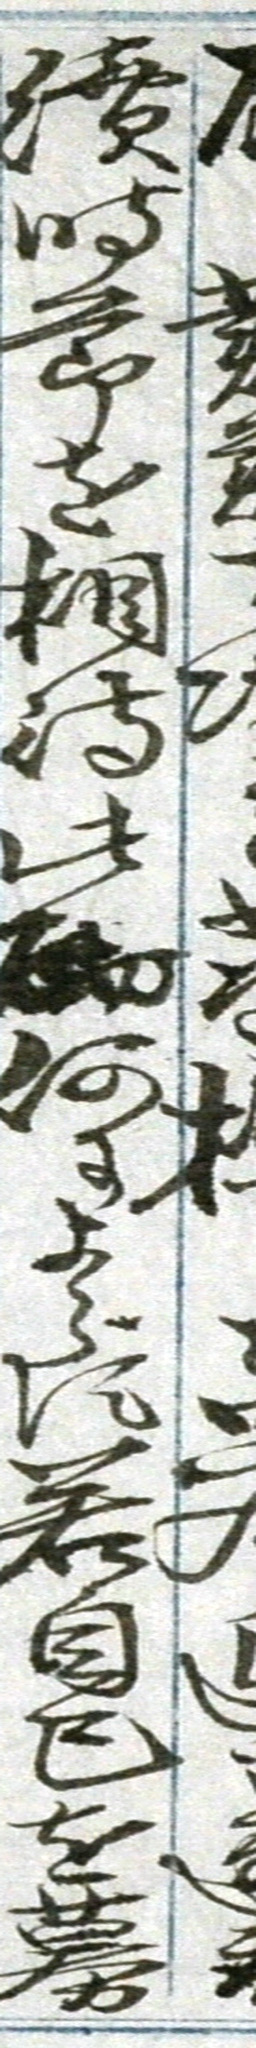続時節を相待此砌何によらず若自己を募
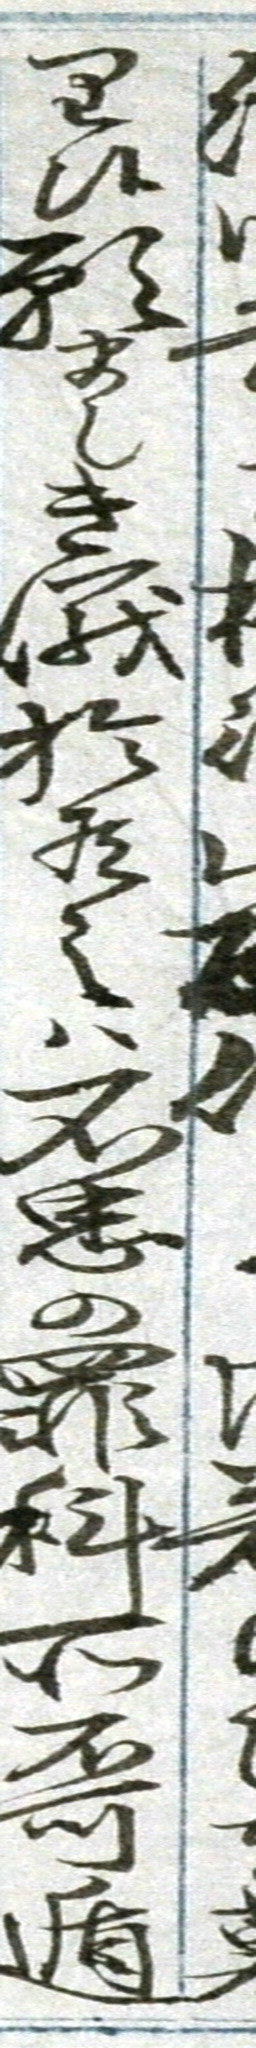り候願ましき儀於有之ハ不忠の罪科所不可遁
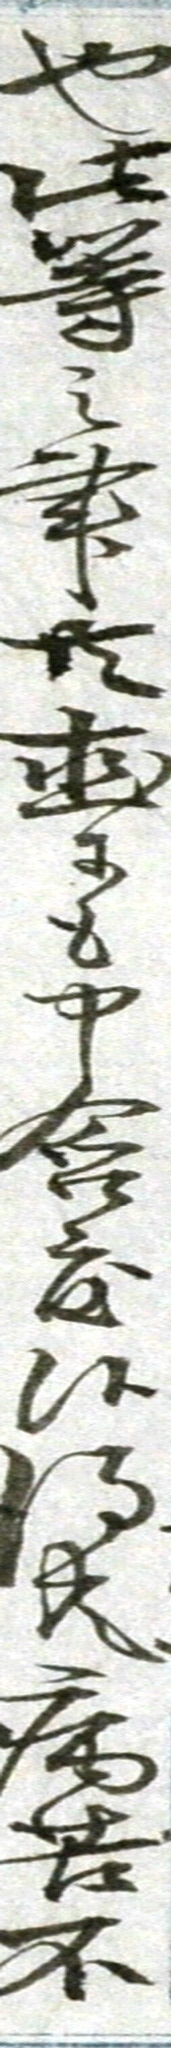也此等之事共直にも申含度候得共病苦不
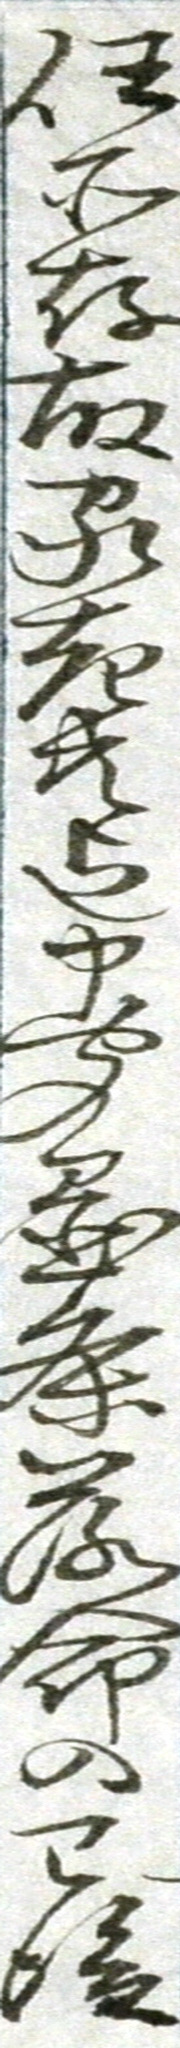任所存故家老共迄申聞置条落命の已後
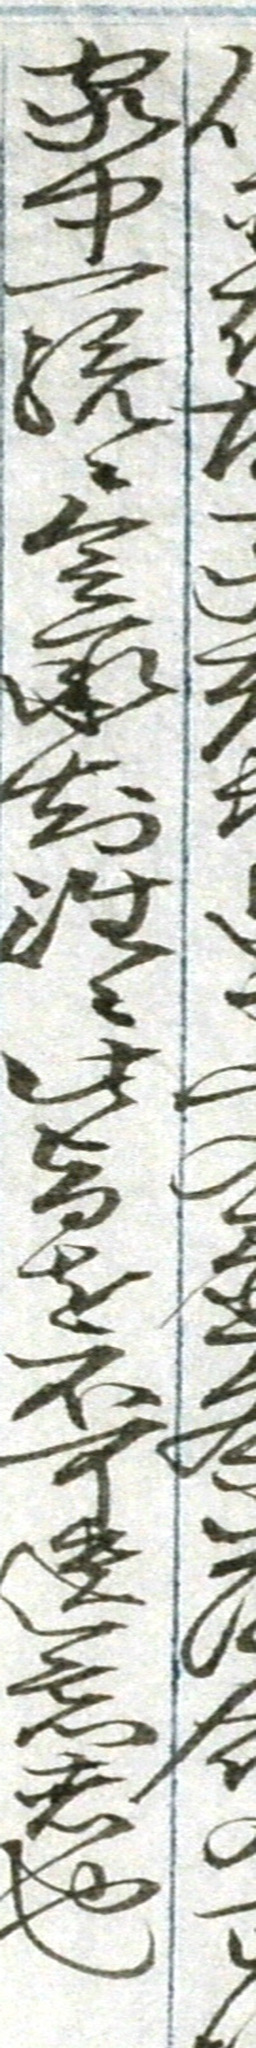家中一統ニ令承知往々此旨を不可遺忘者也
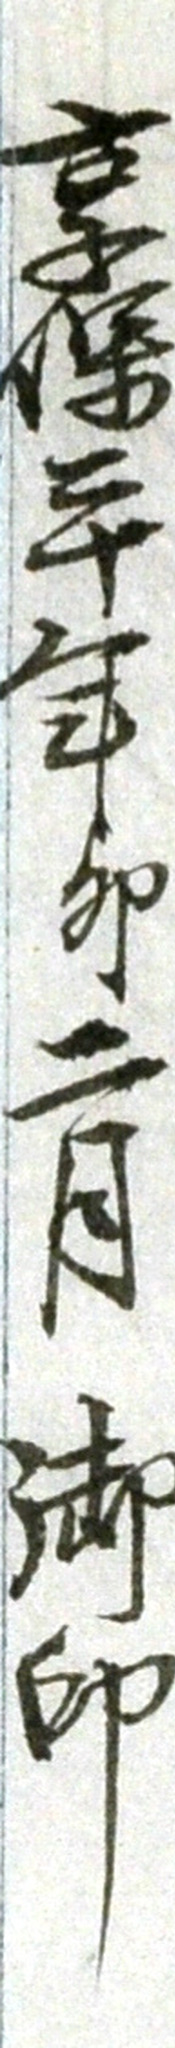享保二十年卯二月御印
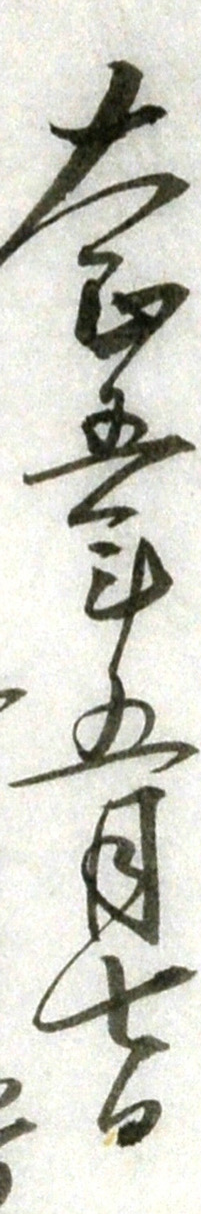大正五年五月七日
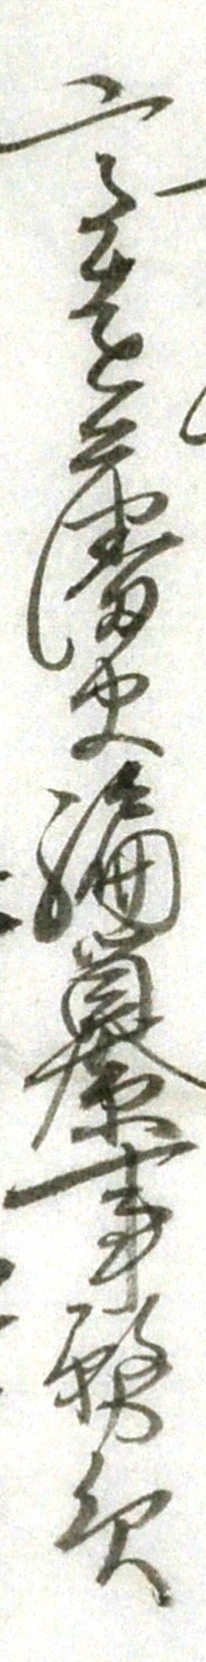高遠藩史編纂事務員
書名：頼卿公（真如院様）御遺訓
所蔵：伊那市立高遠町図書館・合同会社AMANE
